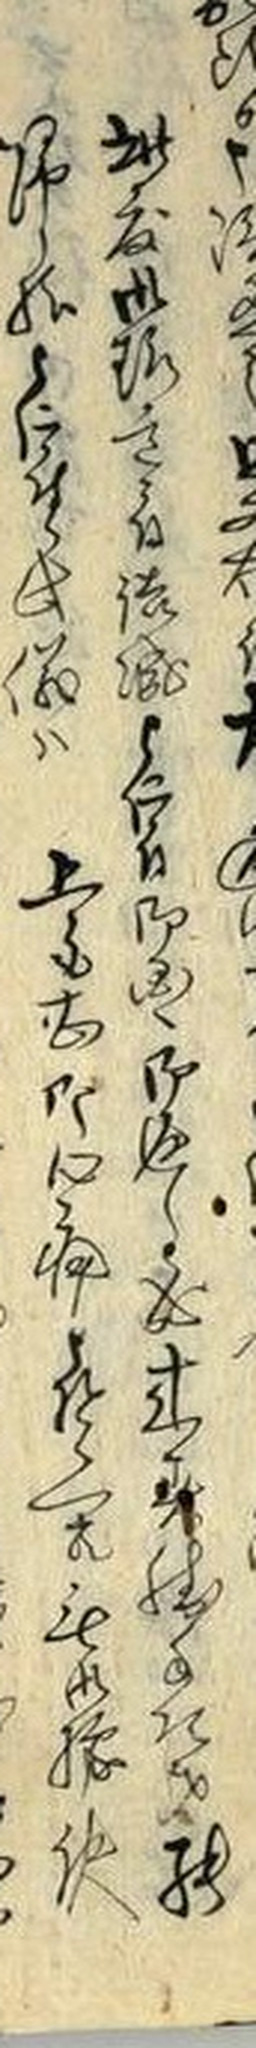帰候様被仰付候此儀ハ上ニも甚御心痛被遊候へ共無御拠訳
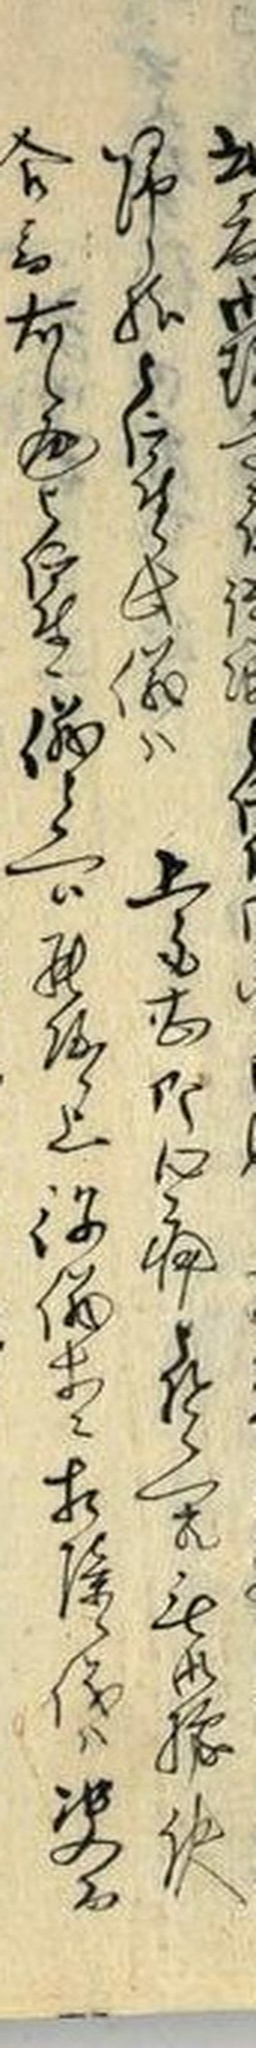合ニ而右之通被仰付候儀ニ候へハ罷帰候上役儀等ニ相障候儀ハ決而
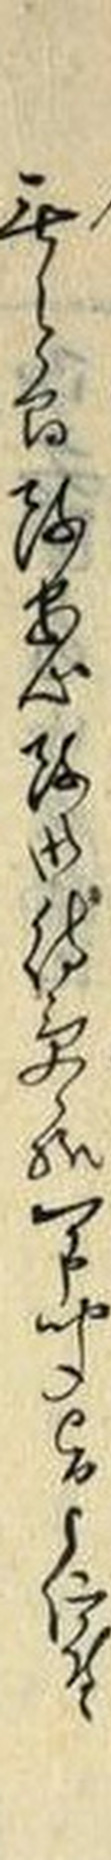無之候間致安心致御待受候様可申聞旨被仰付候
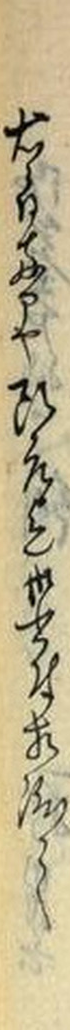右ニ付両部や頭取迄御書付相渡之
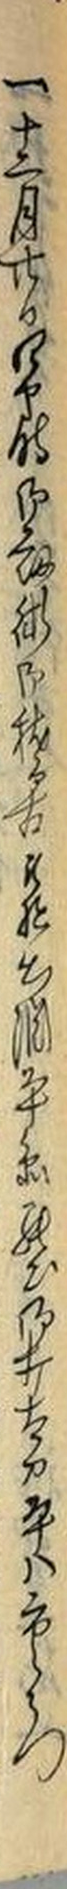一十二月廿日四半時御釼術御稽古被遊出淵平兵衛罷出御打太刀平八市右衛門
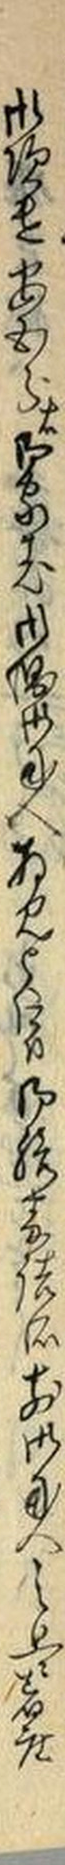御次遣安五郎右御家老御側御用人拝見被仰付御膳番詰所前御用人之上ニ着座
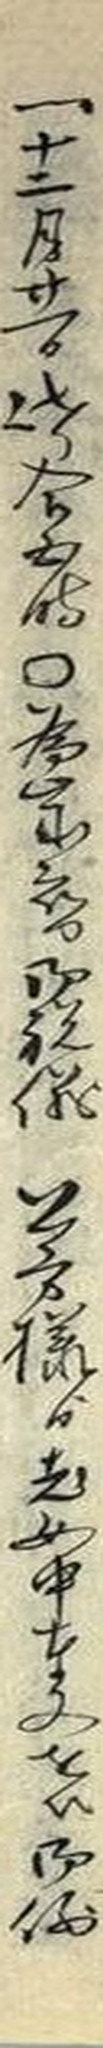一十二月廿一日代り合五時〇為歳暮御祝儀公方様ゟ老女中奉文を以御例
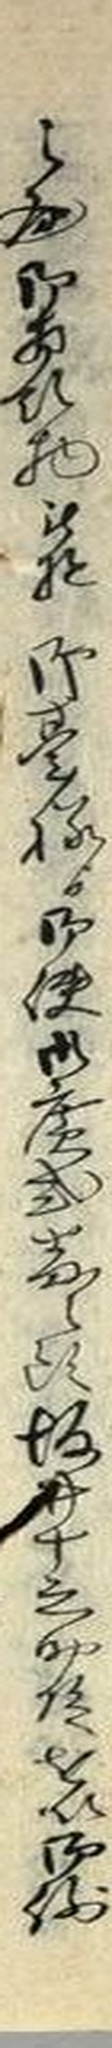之通御拝領物被遊御台様ゟ御使御広式番之頭坂井十之助殿を以御例
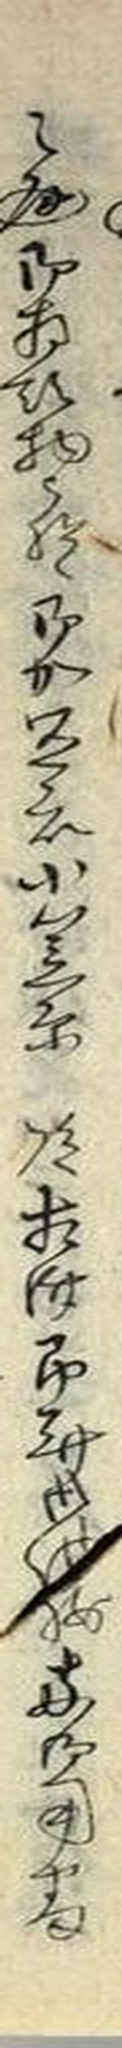之通御拝領物被遊候御加宜衆小笠原殿相済即刻御供揃両御用番
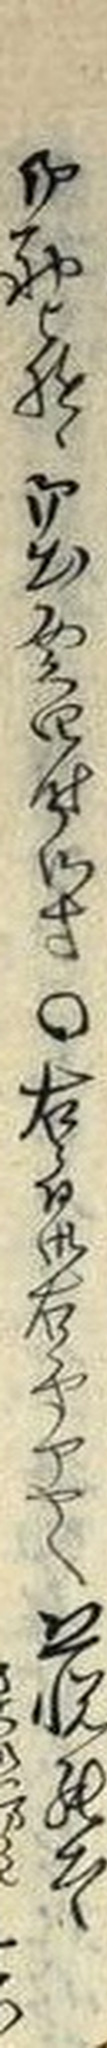御勤被遊候御出殿四時弐寸〇右ニ付御右筆部やへ恐悦罷出候

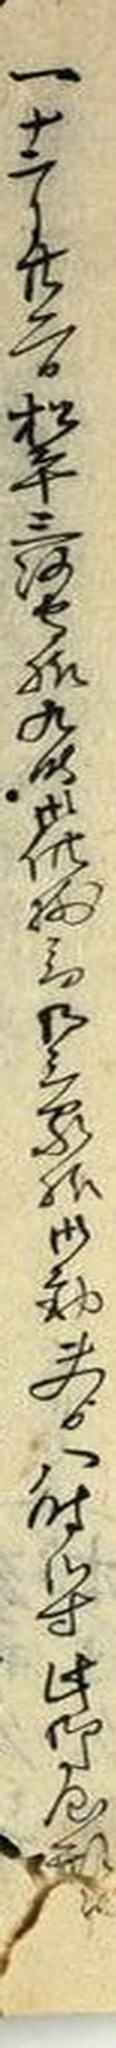ヽ十二月廿二日松平三河守様九時御供揃ニ而御三家様御勤夫ゟ八時弐寸此御屋形江
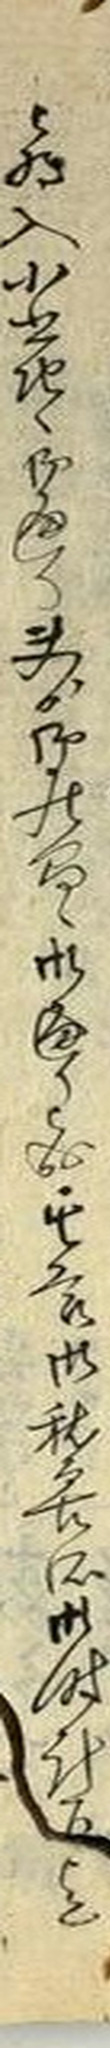被為入小書院へ御通り夫ゟ御居間へ御通り被成其節御稽古所御時計下迄
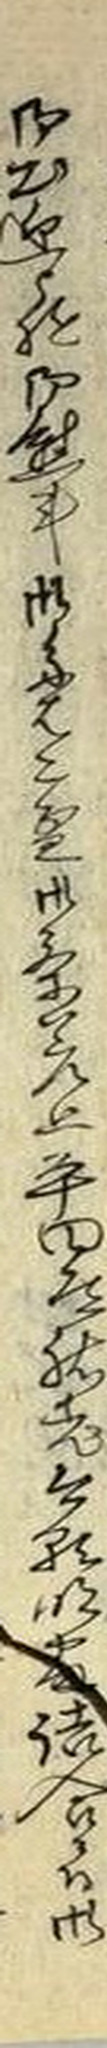御出迎被遊御熨斗御たはこ盆御茶差上平田道祐老今朝明番詰合ニ付御
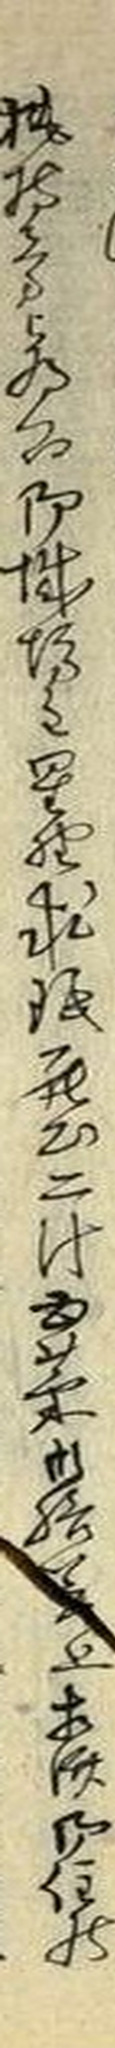執持旁被為召御城坊主星野求珉罷出二汁五菜御膳差上相済御住居
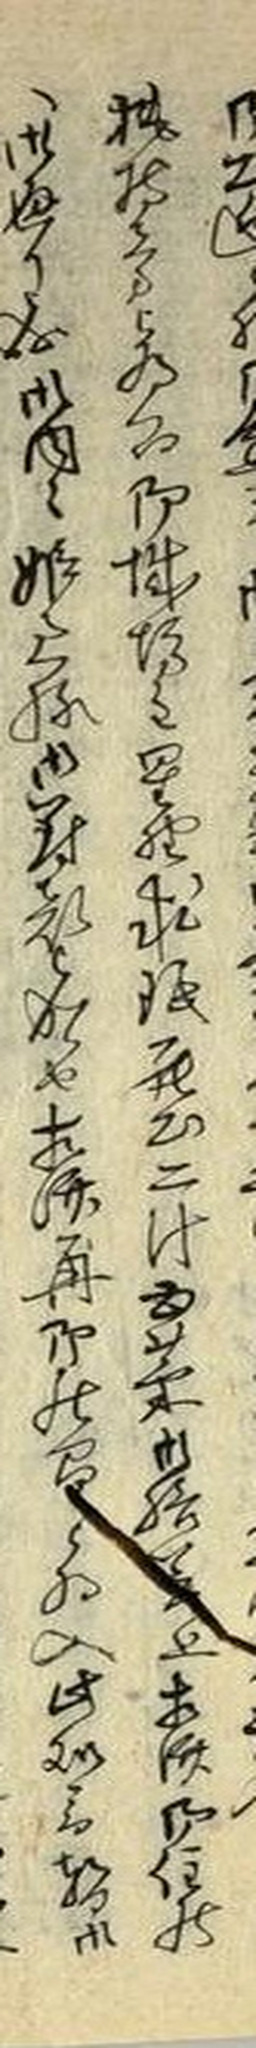へ御通り被成御内々姫君様御対顔被成候由相済再御居間へ被為入此処ニ而都而御
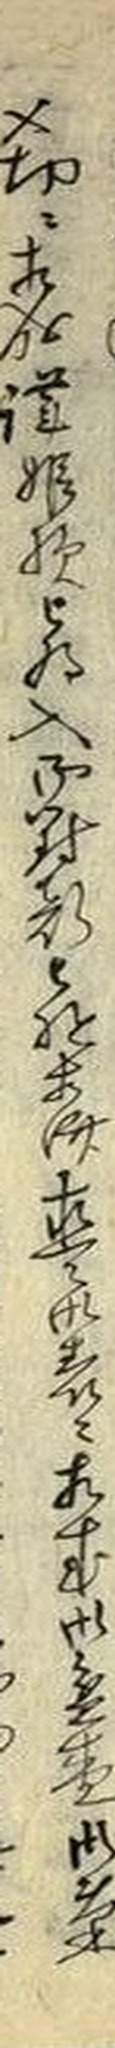〆切ニ相成謹姫様被為入御対顔被遊相済直ニ御表ニ相成御盆盛御菓
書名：少傅日録抄（斉承付側向頭取日記、在府）
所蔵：福井県文書館 Fukui Prefectural Archives
